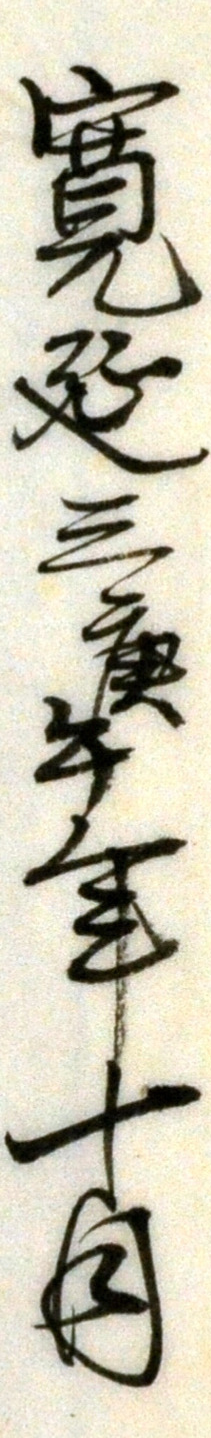寛延三庚午年十月
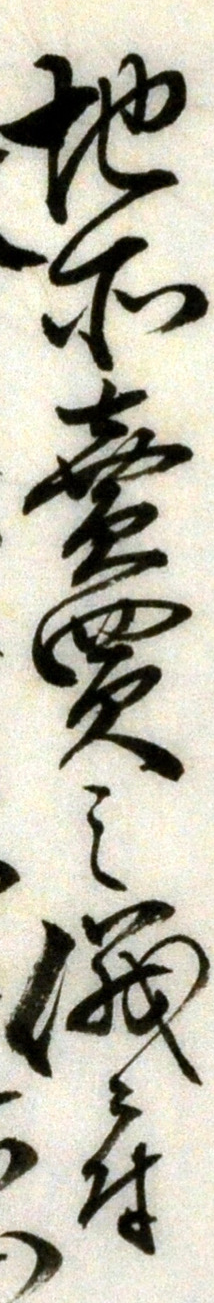地所売買之儀ニ付
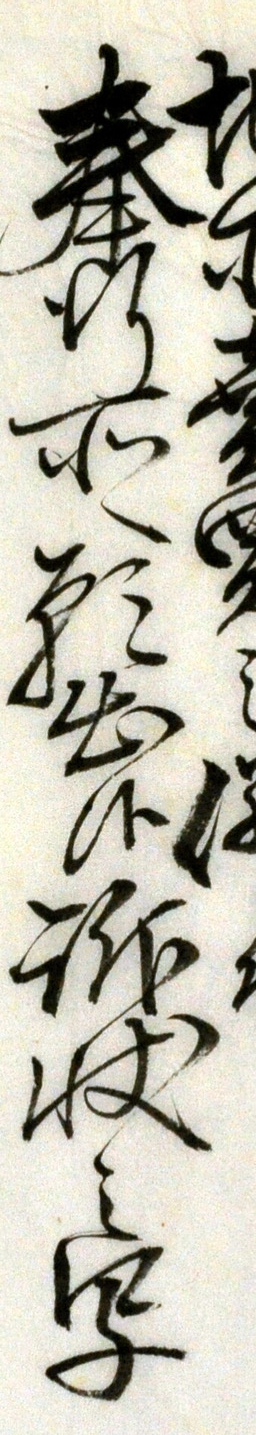奉行所へ願出候訴状之写
